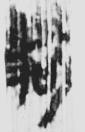○（莊）
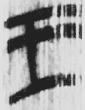王
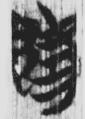既
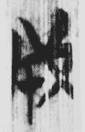成
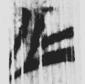亡（無）
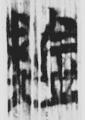鐸（射）
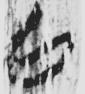㠯（以）
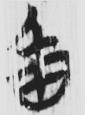昏（問）
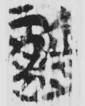○（沈）
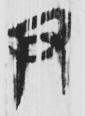尹
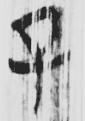子
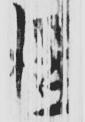桱
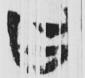曰
